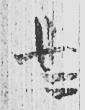廿=
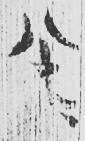八十=
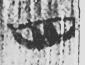四
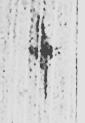十
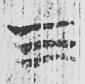三
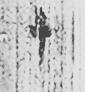十
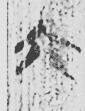六
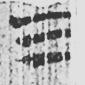三
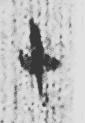十
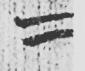二
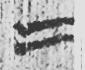二
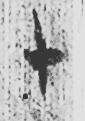十
